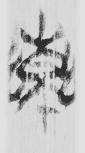藥
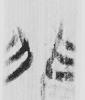非
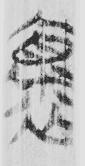褱
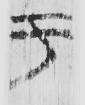于
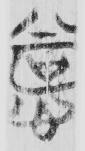愖
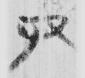四
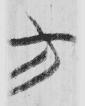方
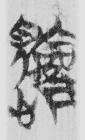{觀心}
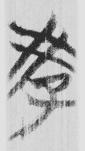𡥈
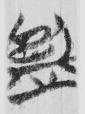監
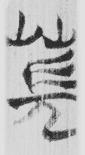{艸𡵂}
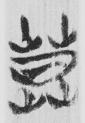莫
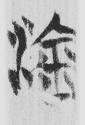淦
